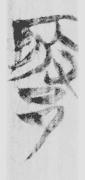{殷邑}
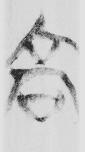高
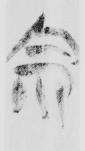宗
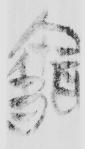{尒䎽}
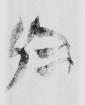於
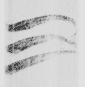三
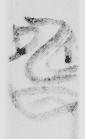𠷎
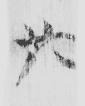{廿八}
